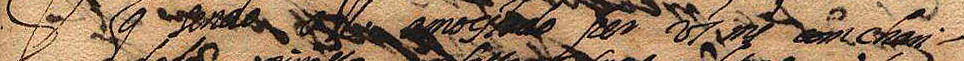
P q̄ sendo o R. amoestado por vs̄ ms̄ com chari
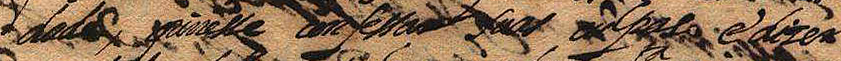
dade, quizesse confessar suas culpas e dizer
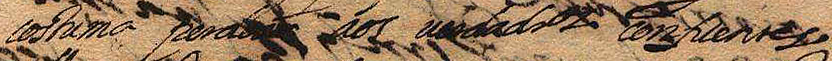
costuma perdoar aos uerdadros confitentes
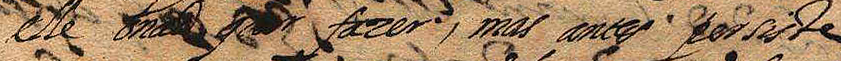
elle o naõ quer fazer, mas antes persiste
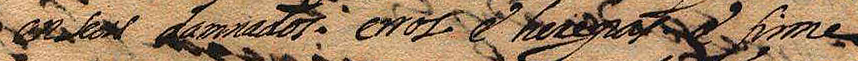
en seus damnados erros e heregias e firme
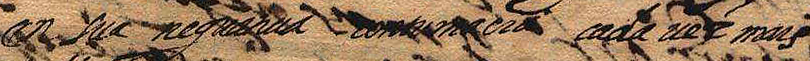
en sua neguancia contumacia cada uez mais
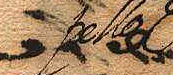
pello q̄
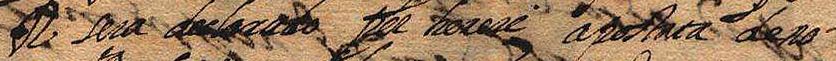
R seia declarado por hereie apostata de no
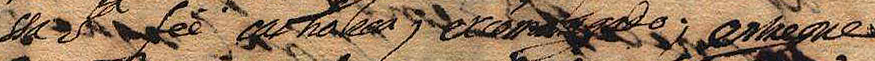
ssa sta fee catholica, excōmungado; entregue
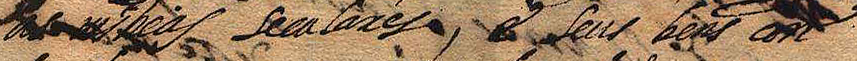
as iustiças seculares, e seus bens con
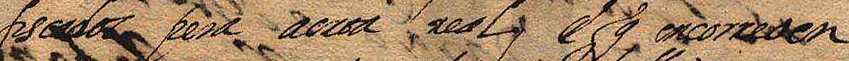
fiscados pera a croa real, e q̄ encorresen
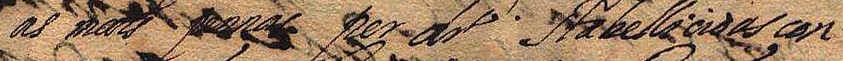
as mais pennas por drto stabellicidas con
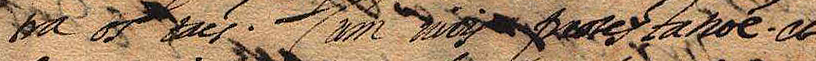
tra os taēs. Cum iuris protestatioē et
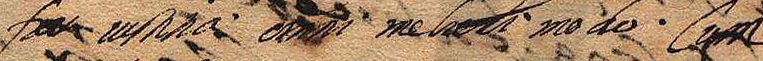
facto iustitia omni meliori modo. Cum
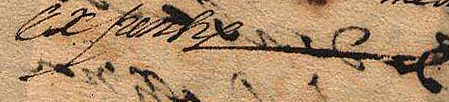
expensis
